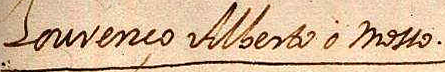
Lourenço Alberto o mosso.
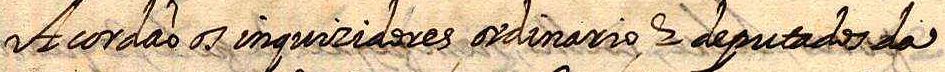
Acordaõ os inquizidores, ordinario, E deputados da
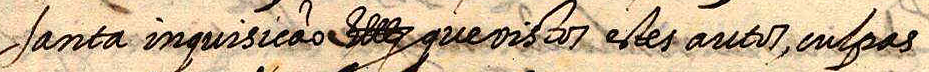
Santa inquisição Ettc que vistos estes autos, culpas
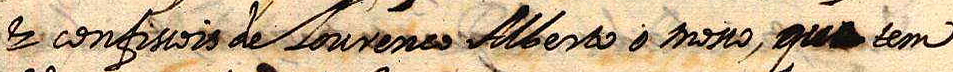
E confissois de Lourenco Alberto o mosso, qu_ tem
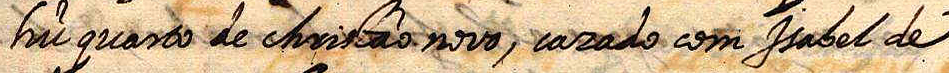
hū quarto de christão novo, cazado com Jsabel de
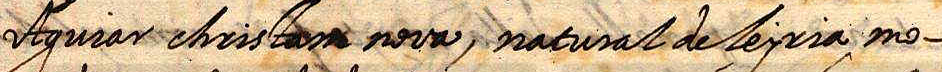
Aguiar christam nova, natural de leyria, mo
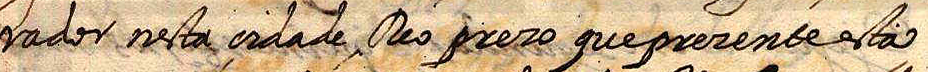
rador nesta çidade, Reo prezo que prezente esta,
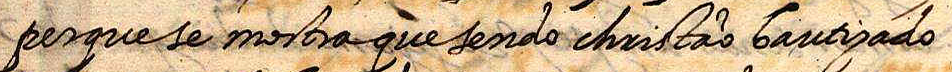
per que se mostra que sendo christão bautizado
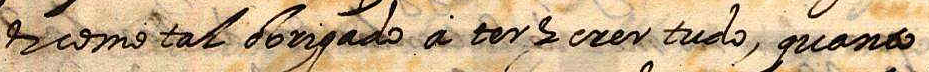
E como tal obrigado a ter, E crer tudo, quanto
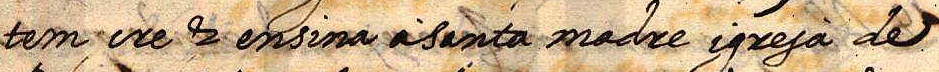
tem, cre E ensina a santa madre igreja de
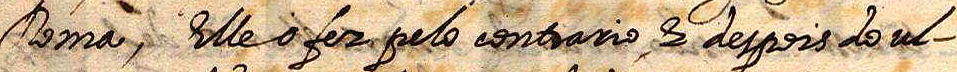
Roma, Elle o fez pelo contrario, E despois do ul
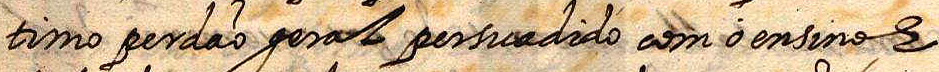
timo perdão geral persuadido com o ensino E
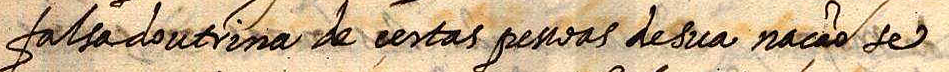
falsa doutrina de çertas pessoas de sua nação se
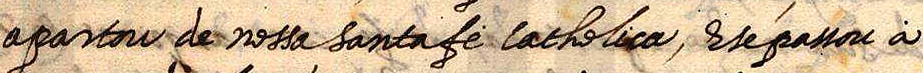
apartou de nossa santa fe catholica, E se passou a
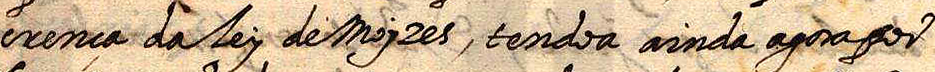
crença da ley de Moyzes, tendoa ainda agora por
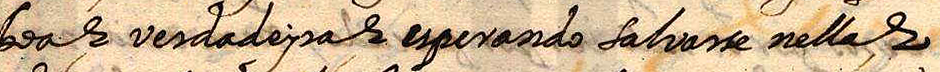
boa, E verdadeyra E esperando salvarse nella, E
